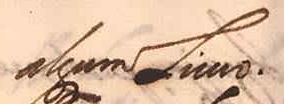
algum Liuro.
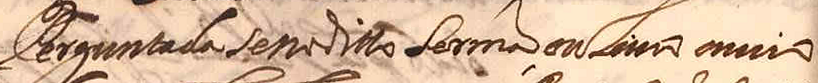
Perguntada se no ditto Sermaõ, ou Liuro ouuio
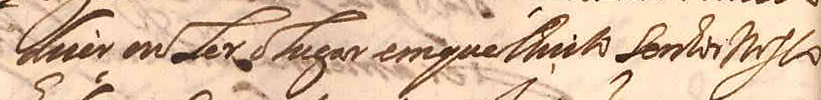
dizer, ou Ler o lugar em que Christo Senhor Nosso
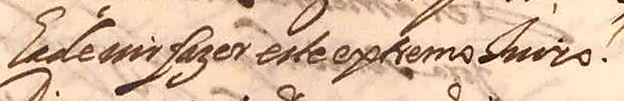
ha de uir fazer este extremo Iuizo?
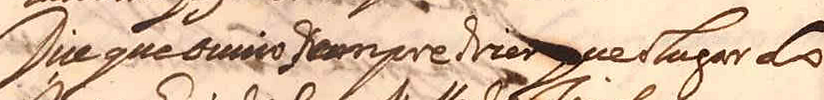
Dice que ouuio sempre dizer que o lugar do
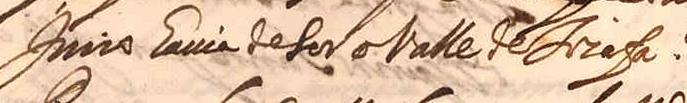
Juizo hauia de ser a Valle de Iozafa.
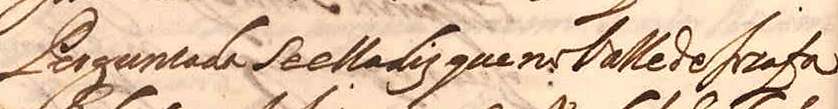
Perguntada se ella diz que no Valle de Jozafa
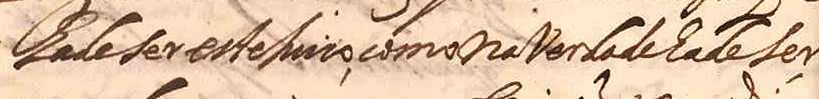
ha de ser este Juizo, como na verdade ha de ser
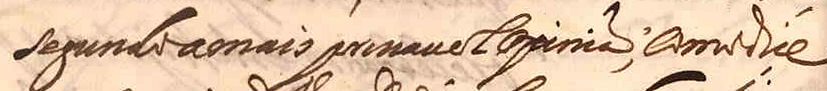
segundo a mais prouauel opiniaõ; como dice
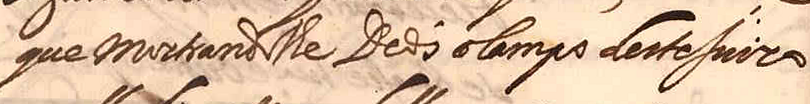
que mostrandolhe Deos o Campo deste Juizo
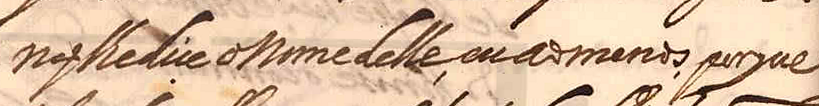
naõ lhe dice o nome delle, ou ao menos, porque
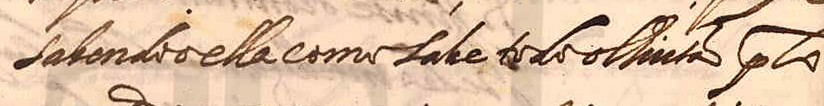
sabendoo ella como sabe todo o Christaõ p̄lo
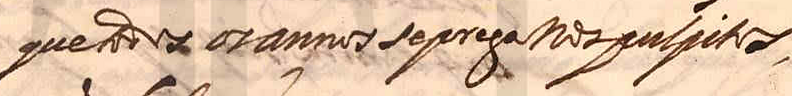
que todos os annos se prega nos pulpitos,
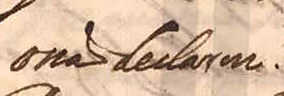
o naõ declarou?
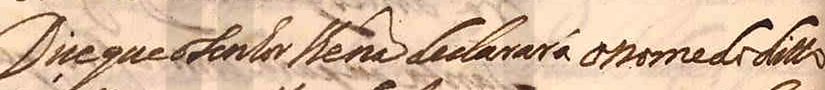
Dice que o Senhor lhe naõ declarara o nome do ditto
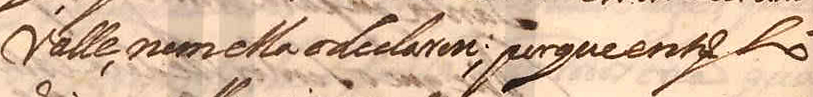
Valle, nem ella o declarou; porque entaõ só
